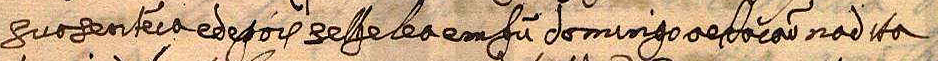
sua sentēça e depois se lhe lea em hū domingo a estaçaõ na dita
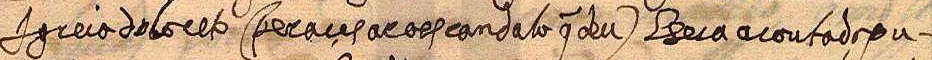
Igreia do loreto (pera cesar o escandalo q̄ deu) E seia açoutado pu
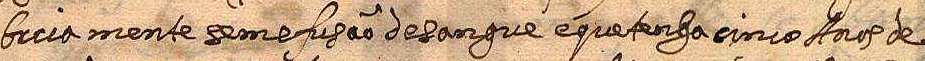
bricamente sem efusaõ de sangue e que tenha cinco Anos de
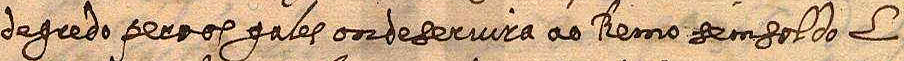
degredo pera as gales onde seruira ao Reino sem soldo E
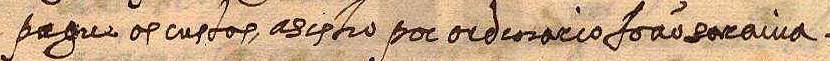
pague as custas, asistio por ordinario Ioaõ saraiua
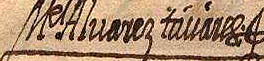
Mel Aluarez tauares
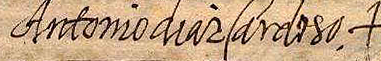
Antonio diaz Cardoso
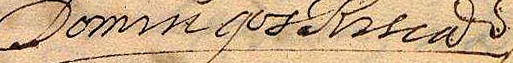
Domingos Riscado
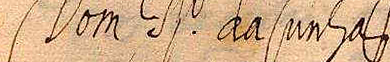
Dom Ro. da Cunha
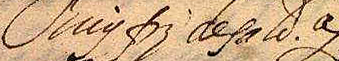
Ruy frz de sald.a
